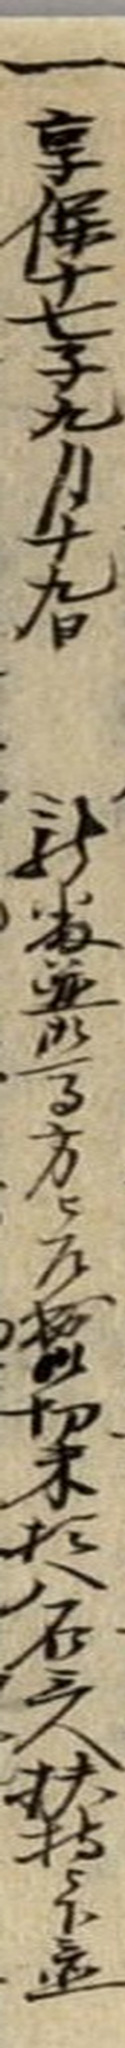一享保十七子九月十九日新番並御馬方被召出御切米拾八石三人扶持被下置
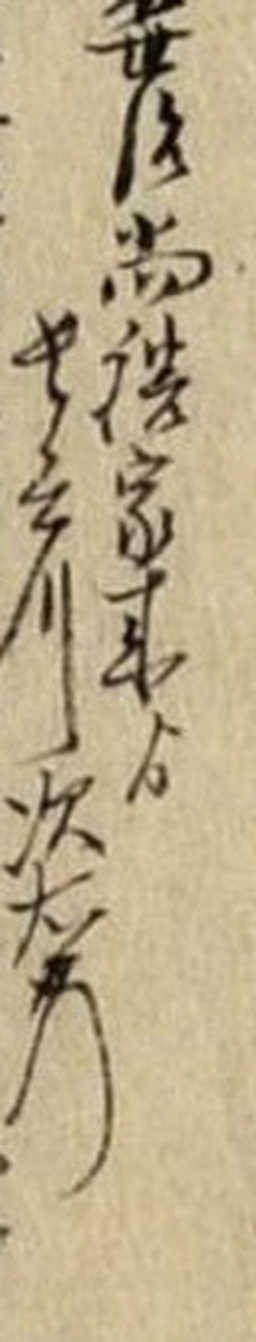長谷川次右衛門
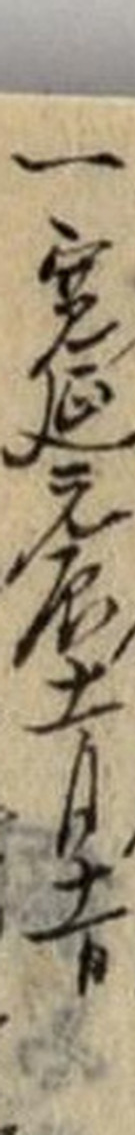一寛延元辰十一月十一日
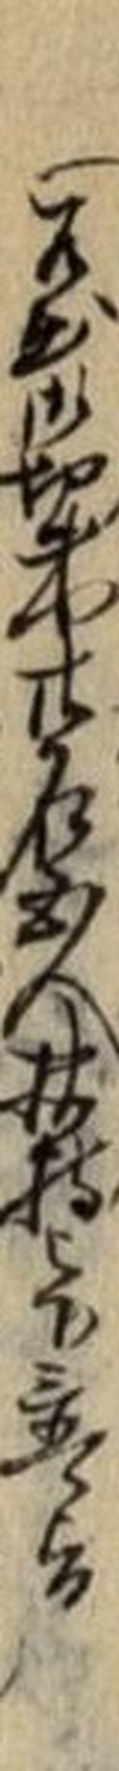召出御切米廿石五人扶持被下置候旨
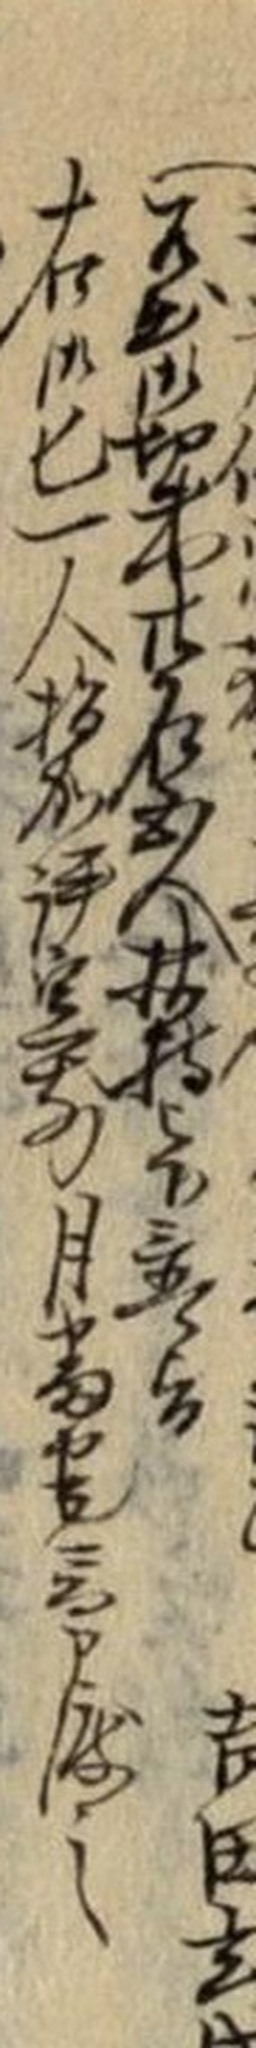右御匙一人指加評定前月番宅に而申渡之
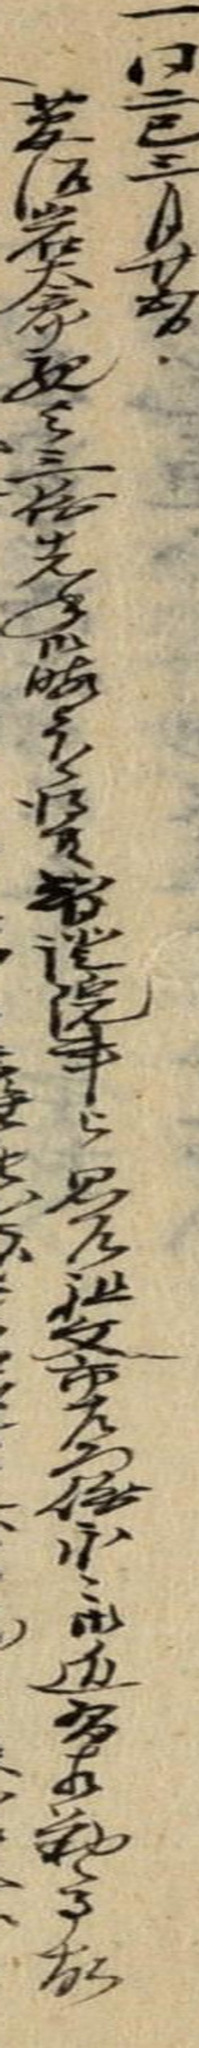菅沼岩太郎親与三儀先年御暇被下候得共智証院事被思召祖父市左衛門儀永々御近習相勤候事故
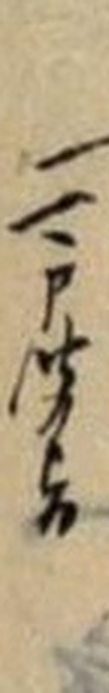可申聞旨
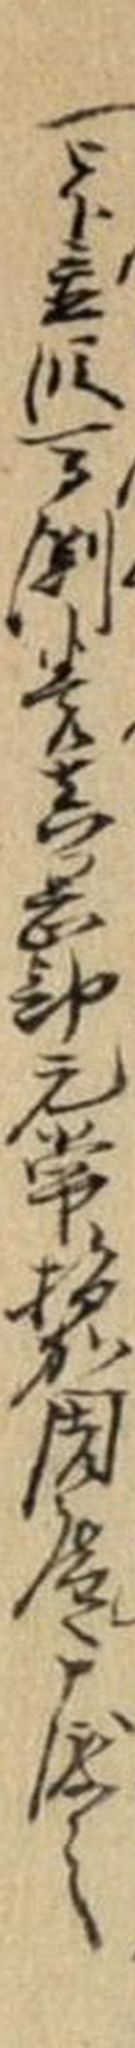被下置段馬淵養真へ岡部元常指加周庵へ申渡之

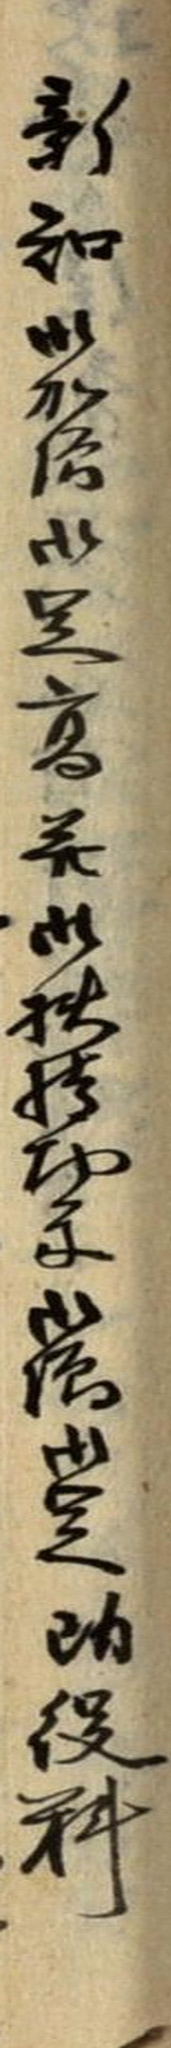新知御加増御足高并御扶持切米御増御足附役料
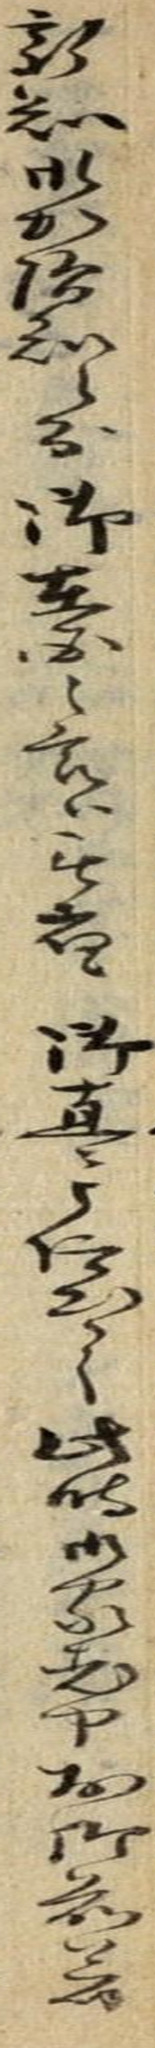一新知御加増知之分御在国之節は其者へ御直々被仰出之此時御家老中於御前着
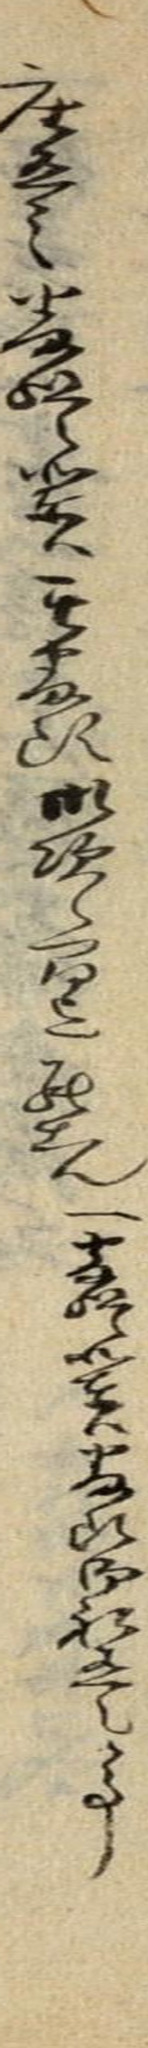座有之番組之輩は其番頭御次之間迄罷出ル一番組之輩は番頭御礼有之候事
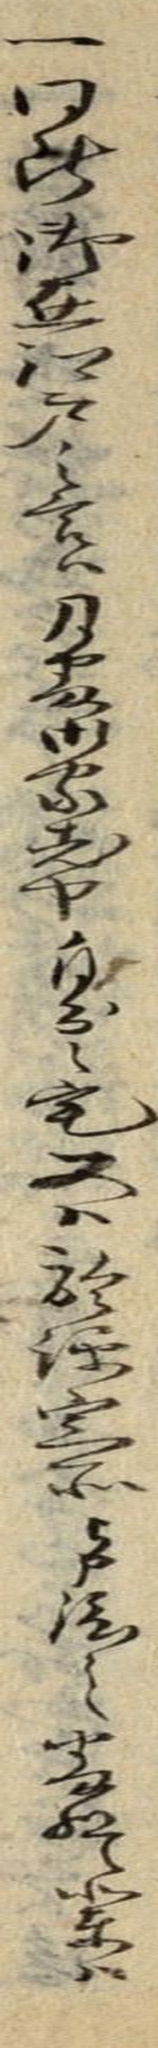一同断御在江戸之節は月番御家老中自分之宅又は於評定所被申渡之番組之輩は
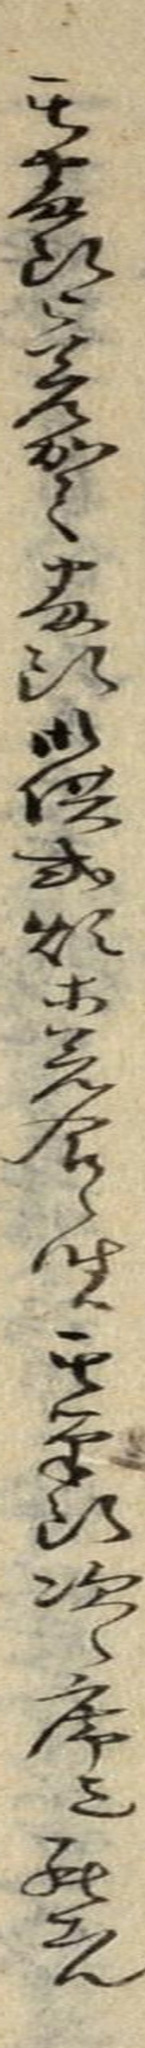其番頭被差加之番頭御供或煩等差合候時は其筆頭次之席迄罷出ル
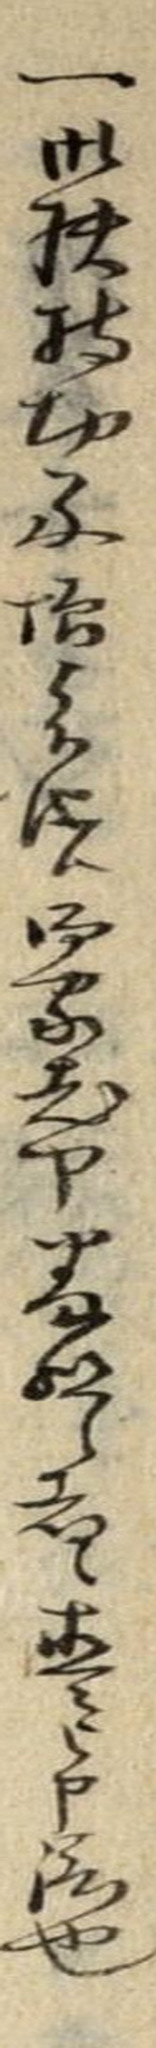一御扶持切米増被下候儀は御家老中番組之者へ直々被申渡也
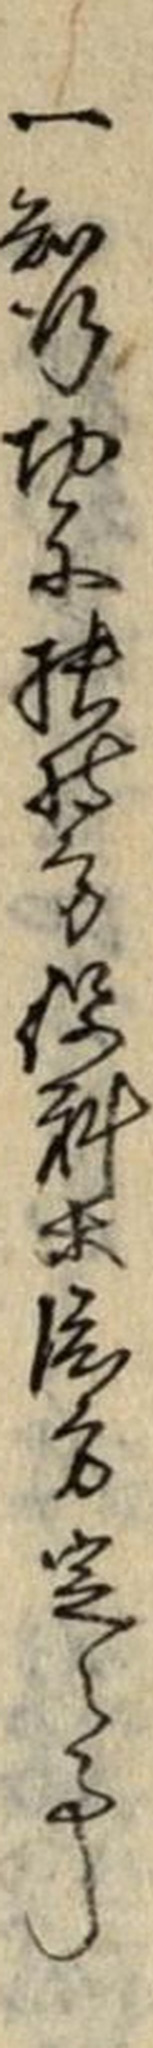一知行切米扶持方役料等渡方定之事
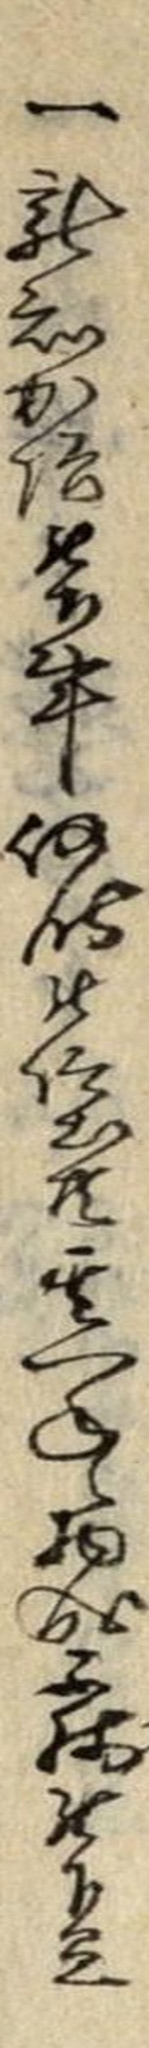一新知加増被下事何時被仰出共其一年之物成不残被下置
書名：御用并被仰出之部
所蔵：福井県文書館 Fukui Prefectural Archives
